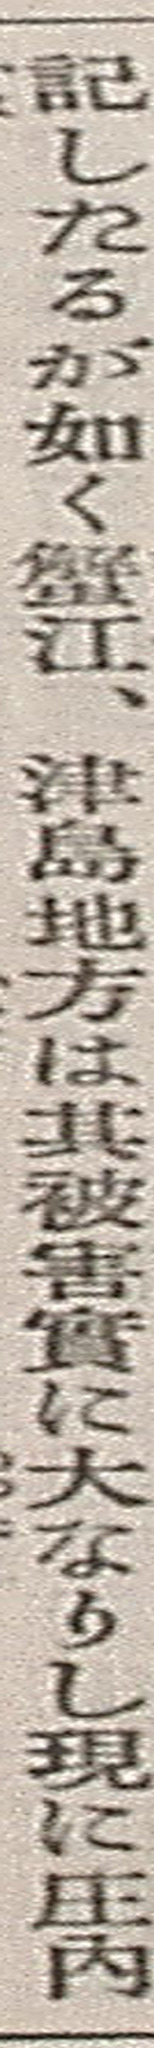記したるが如く蟹江、津島地方は其被害実に大なりし現に庄内
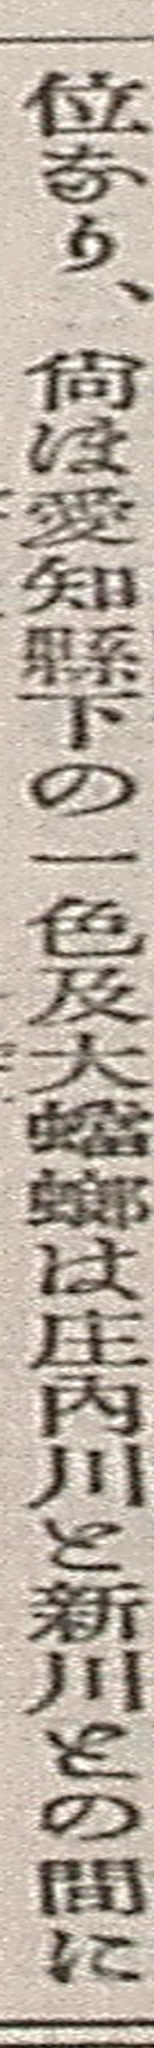位なり、尚ほ愛知県下の一色及大蟷螂は庄内川と新川との間に
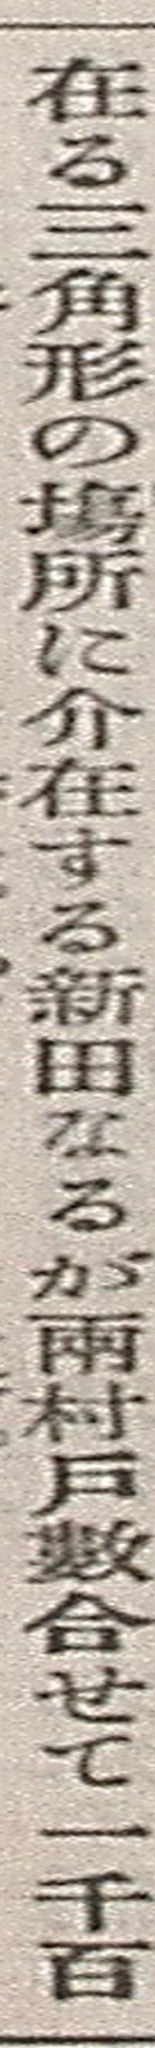在る三角形の場所に介在する新田なるが両村戸数合せて一千百
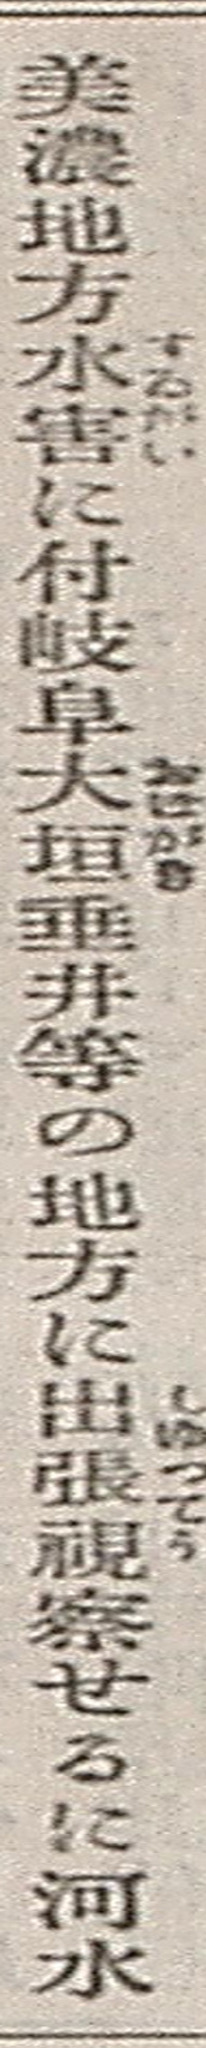美濃地方水害に付岐阜大垣垂井等の地方に出張視察せるに河水
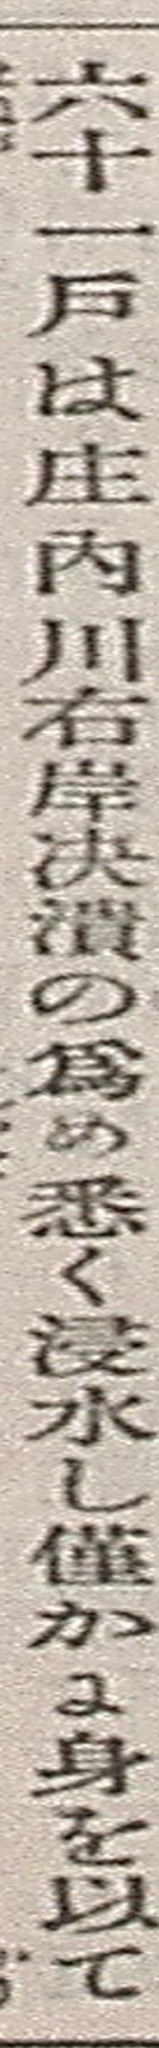六十一戸は庄名川右岸決潰の為め悉く浸水し僅かに身を以て
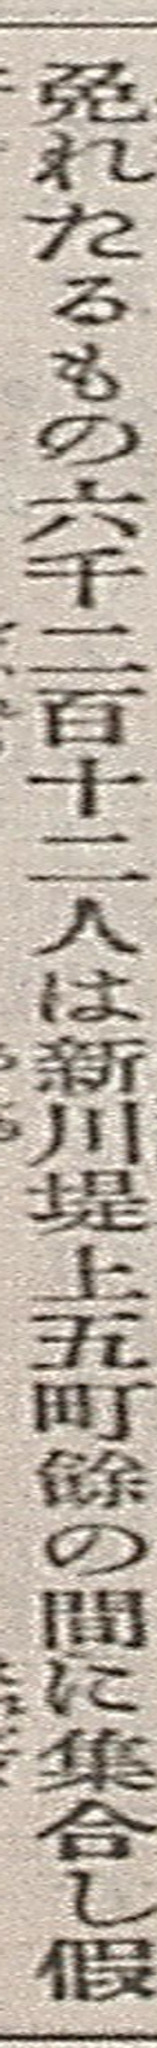免れたるもの六千二百十二人は新川堤上五町餘の間に集合し仮
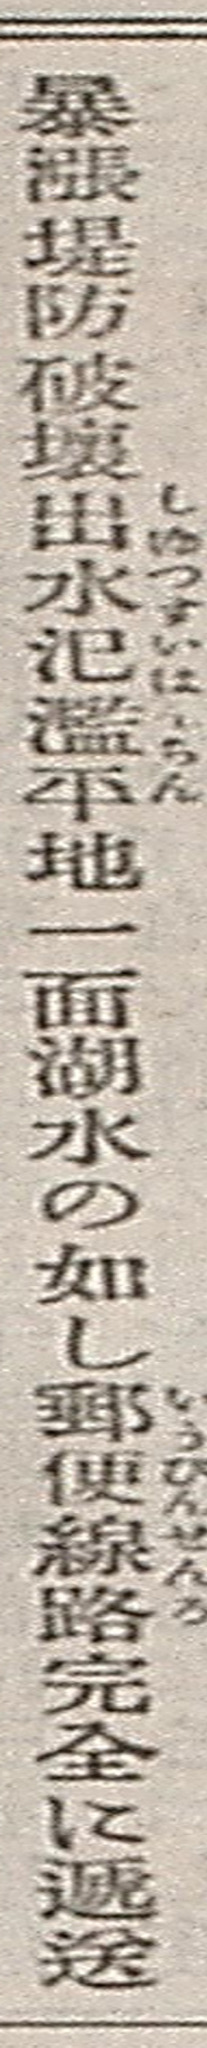暴漲堤防破壊出水氾濫平地一面湖水の如し郵便線路完全に逓送
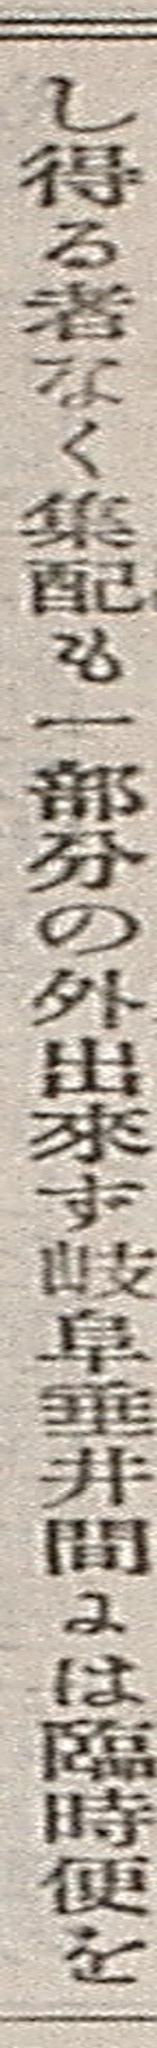し得る者なく集配も一部分の外出来ず岐阜垂井間には臨時便を
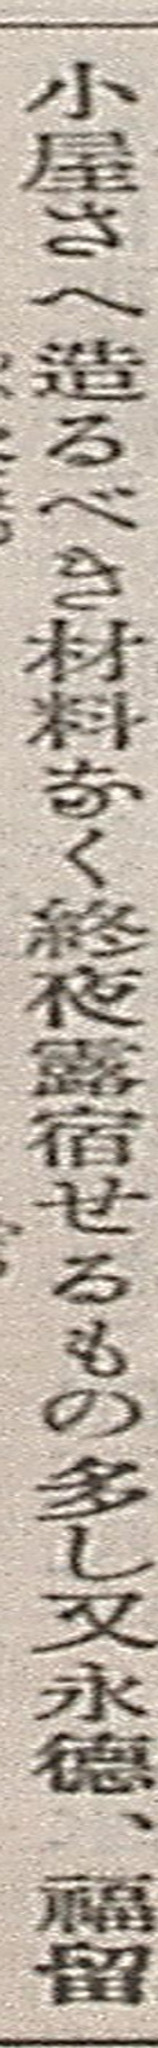小屋さへ造るべき材料なく終夜露宿せるもの多し又永徳、福留
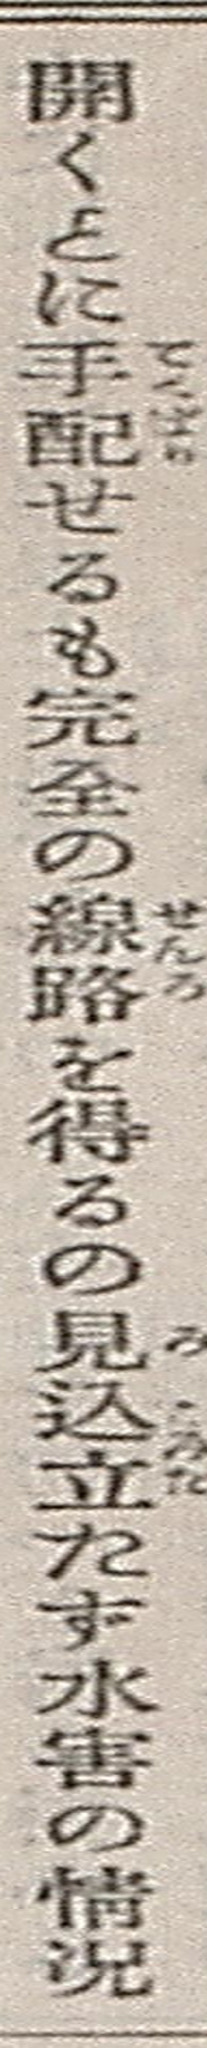開くことに手配せるも完全の線路を得るの見込立たず水害の状況
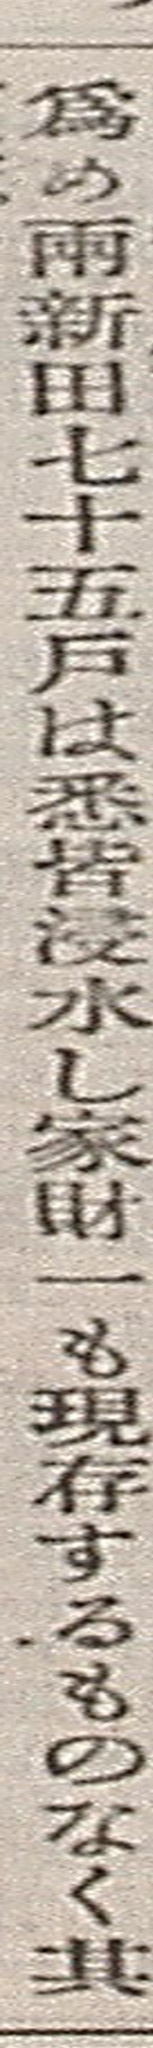為め両新田七十五戸は悉皆浸水し家財一も現存するものなく其
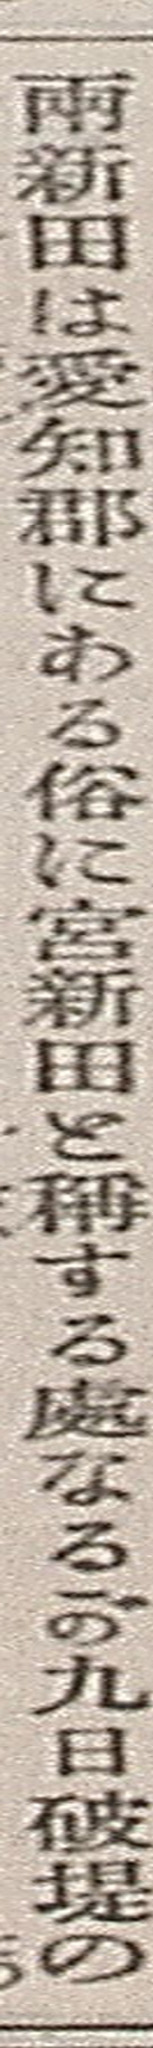両新田は愛知郡にある俗に宮新田と称する処なるが九日破堤の
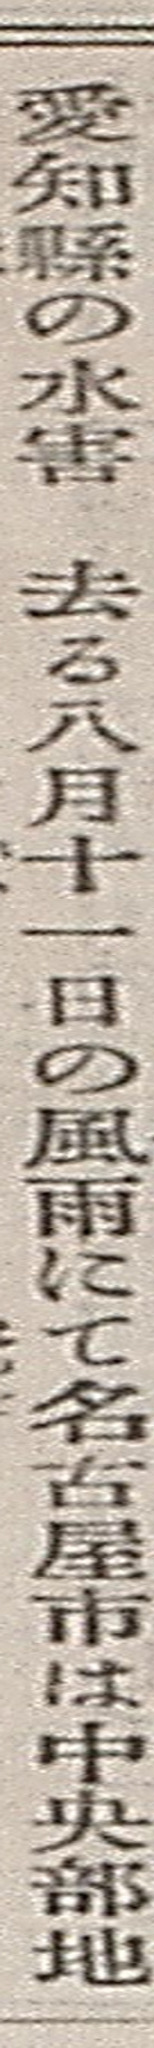愛知県の水害去る八月十一日の風雨にて名古屋市は中央部地
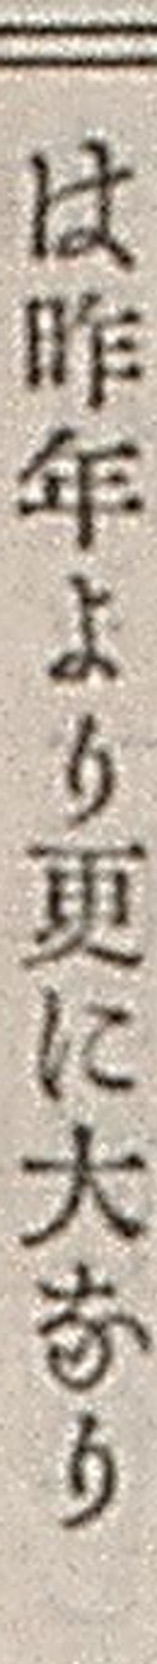は昨年より更に大なり
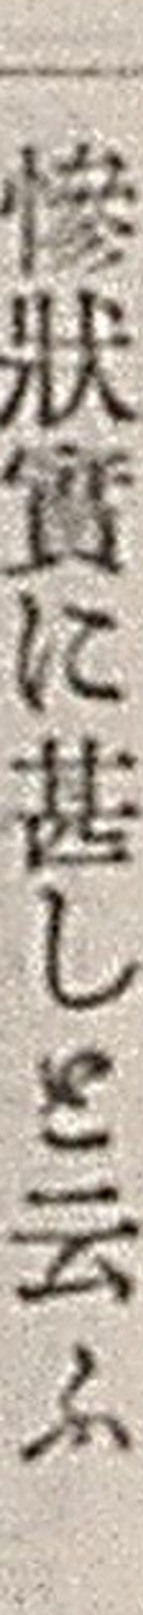惨状実に甚しと言ふ
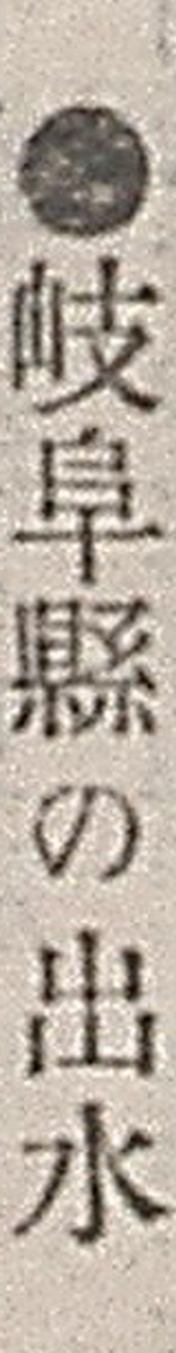●岐阜県の出水
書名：風俗畫報臨時増刊第百二十六號　洪水被害録（中）
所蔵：東京大学地震研究所図書室 Earthquake Research Institute Library, The University of Tokyo, JAPAN
